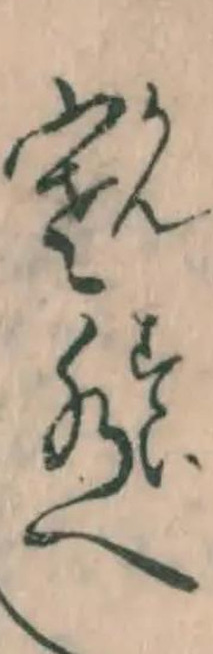寒水へ
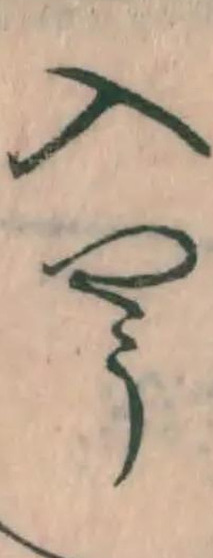入やう

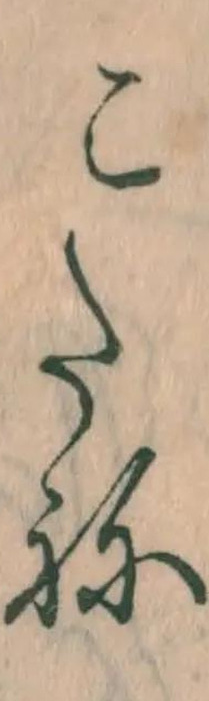こたね
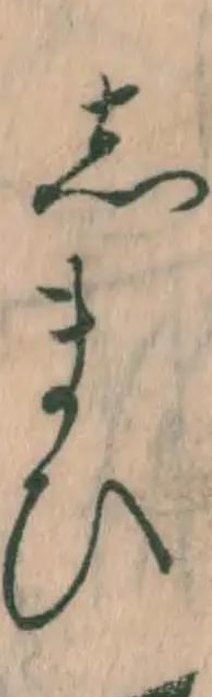しまひ
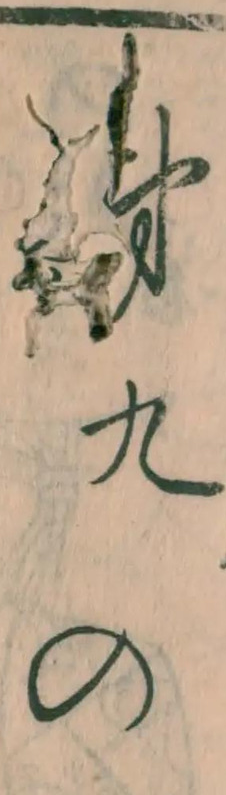第九の

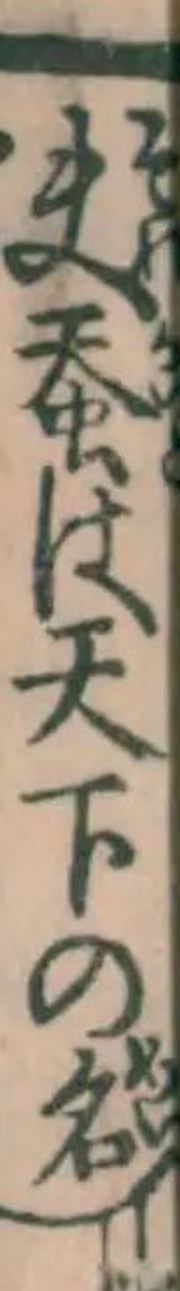夫蚕は天下の名
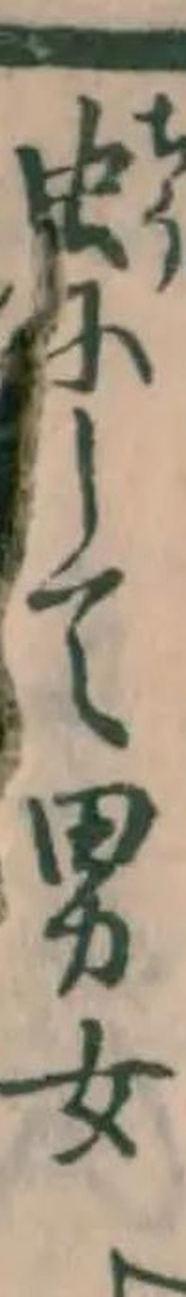虫にして男女
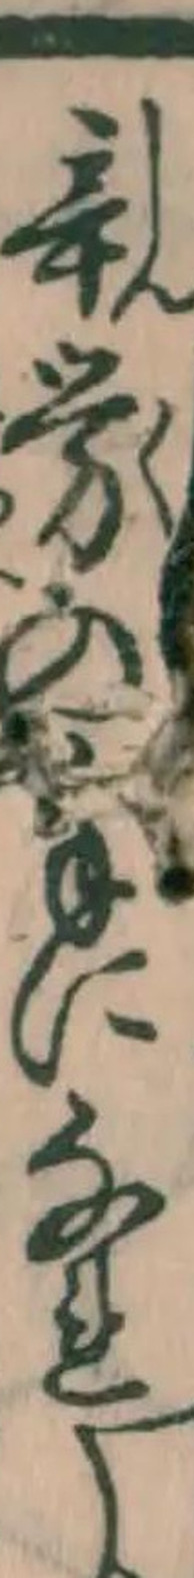辛労のになれ
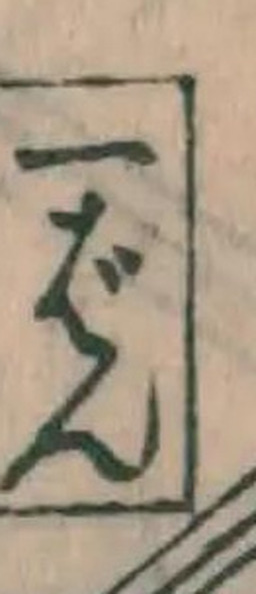一ばん
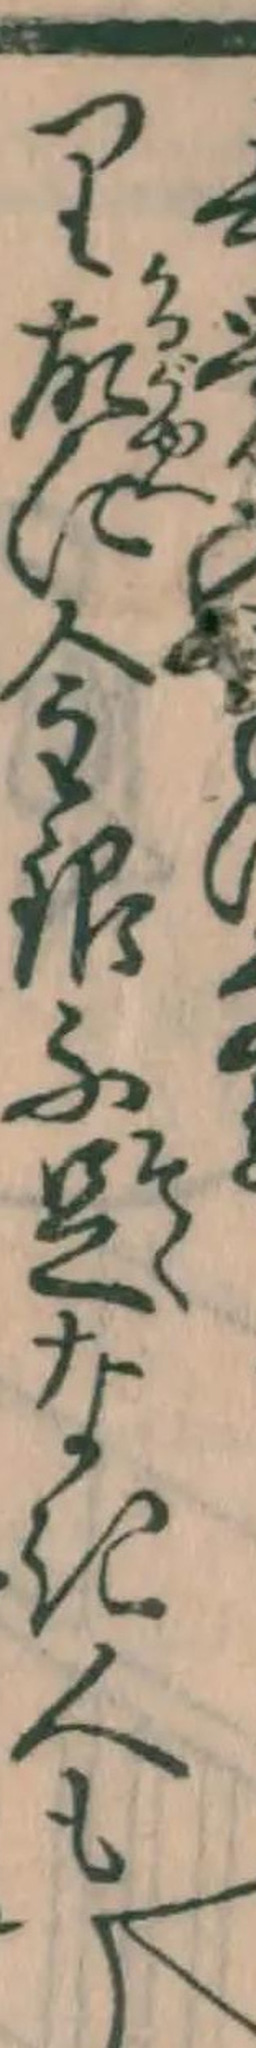り故に金銀不足なき人も
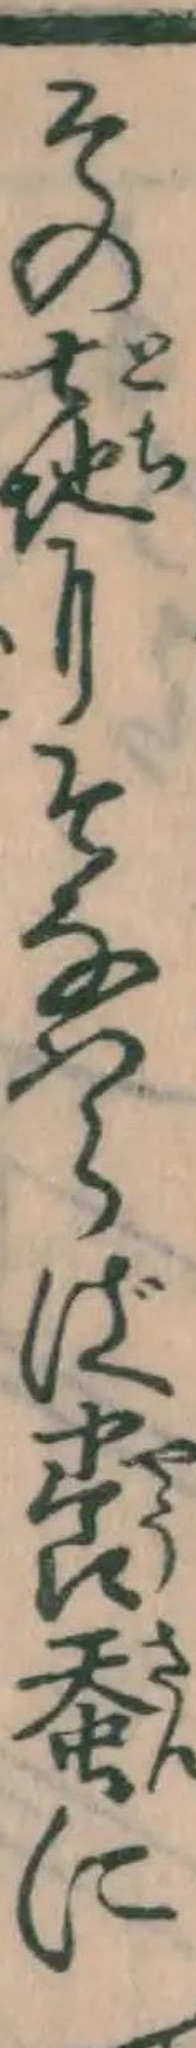その土地にそなはらば養蚕に
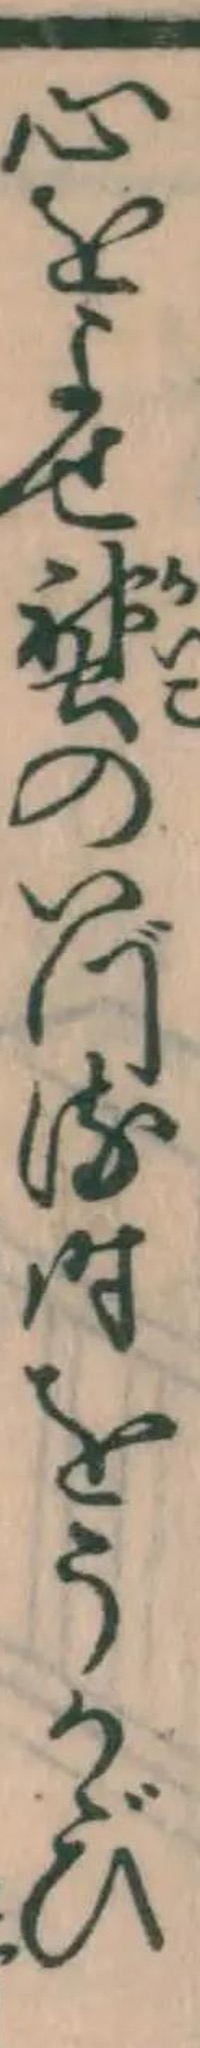心をよせ䗝のいづる時をうかゞひ
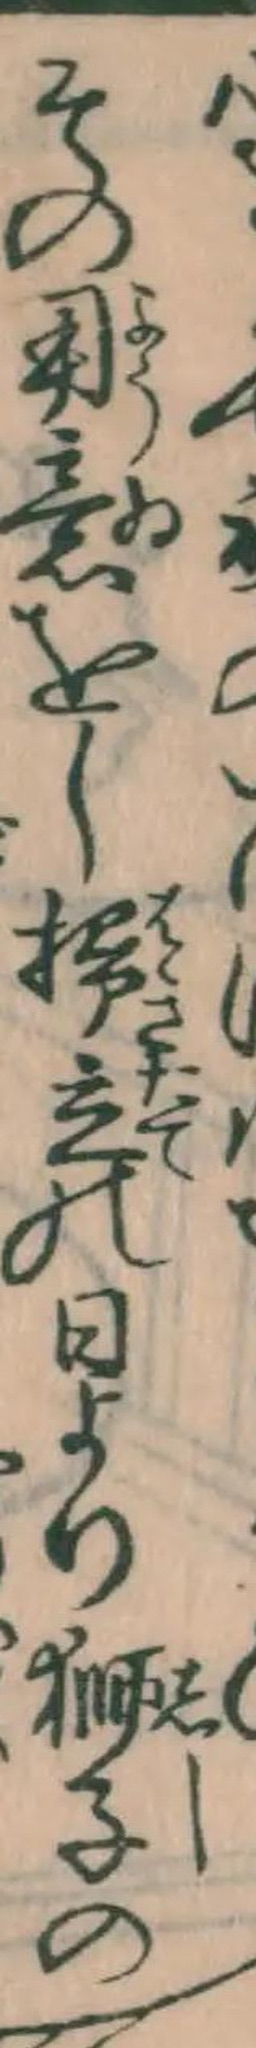その用意をし掃立の日より獅子の
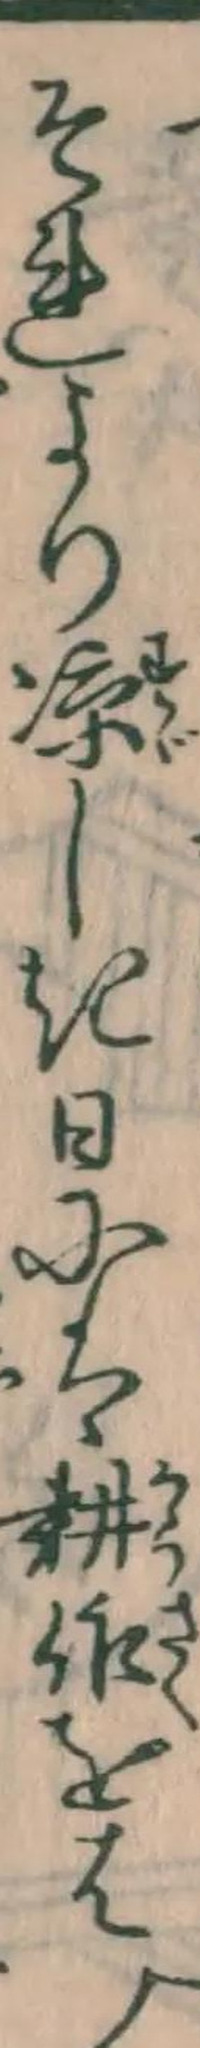それより涼しき日には耕作をは
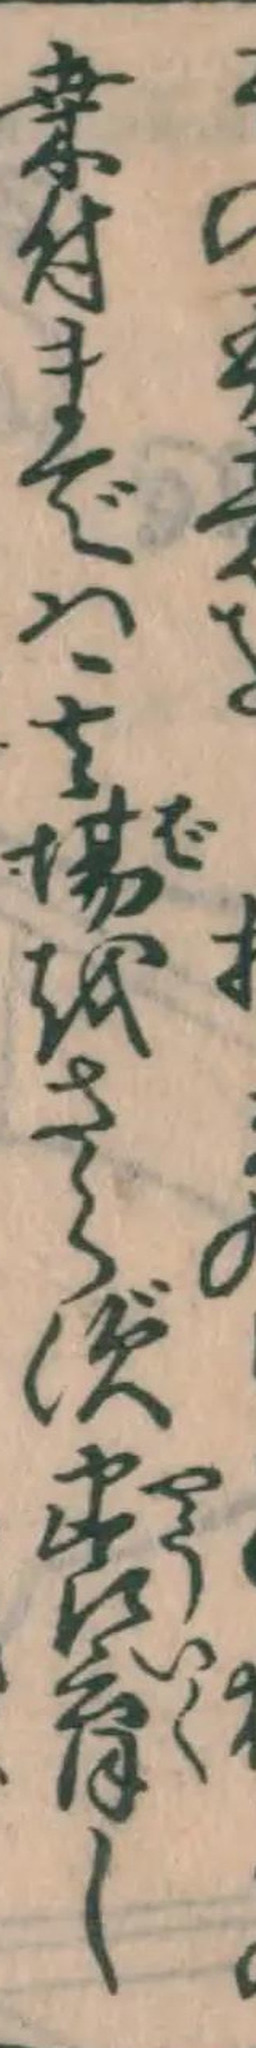桑付までは其場をさらず養育し
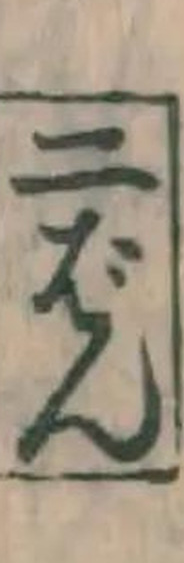二ばん
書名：新撰養蚕秘書
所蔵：国立国会図書館 National Diet Library, JAPAN
